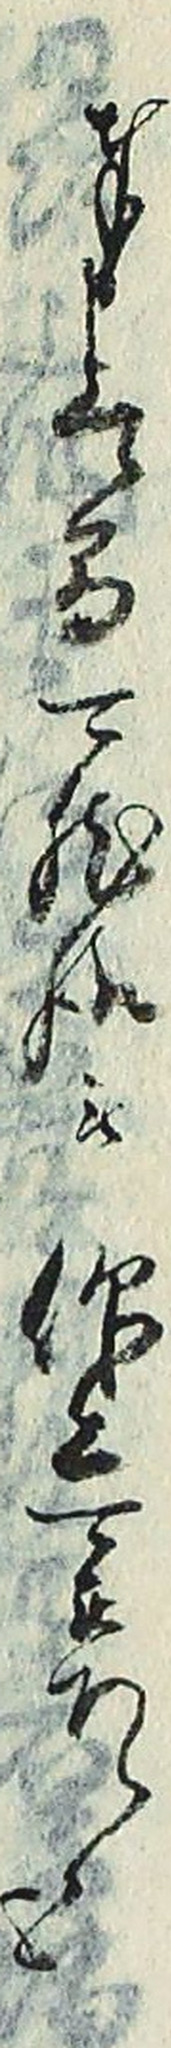奉申上候間可然様被仰上可被下候以上
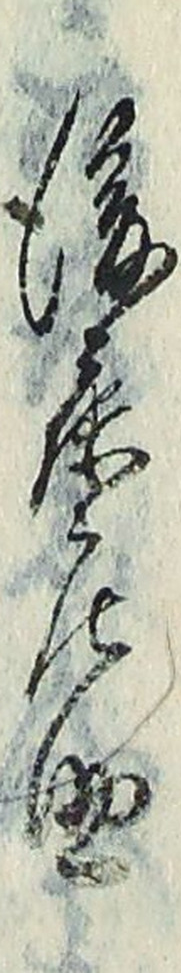後藤庄助
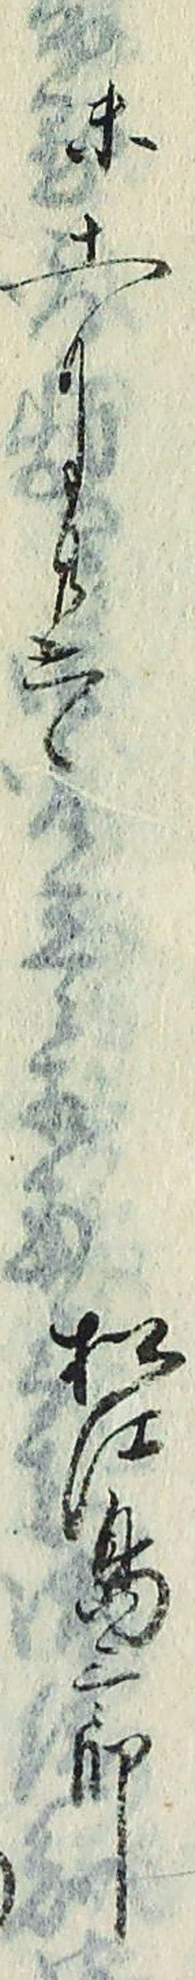未十一月廿六日松江島三郎
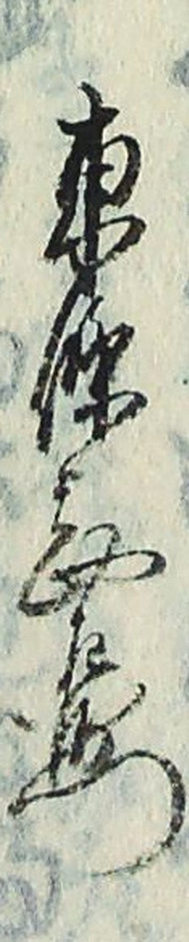東條勘左衛門
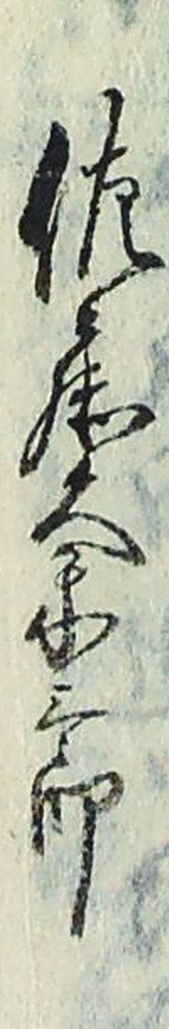佐藤久米三郎
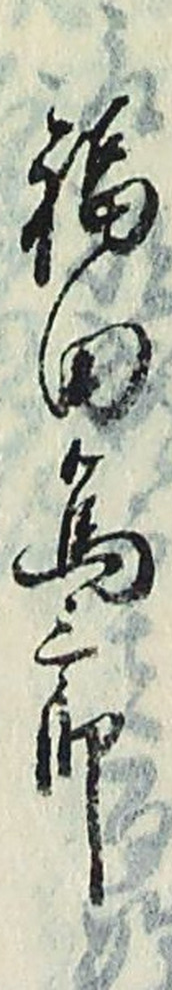福田篤三郎
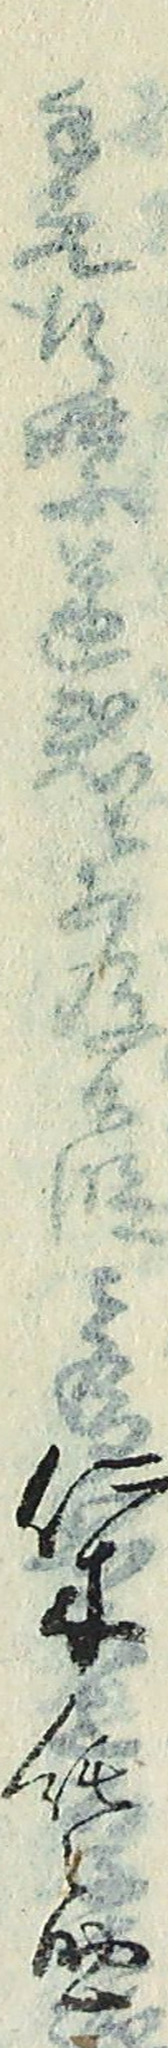仁木純之助
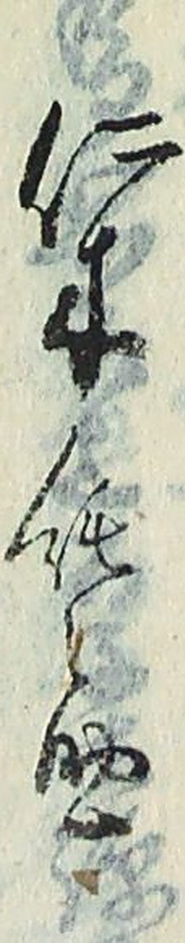仁木純之助
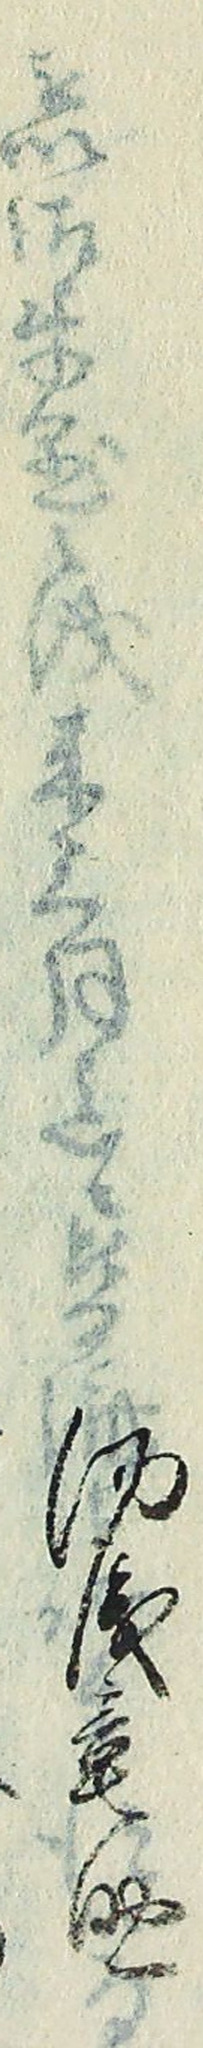湯浅竜助
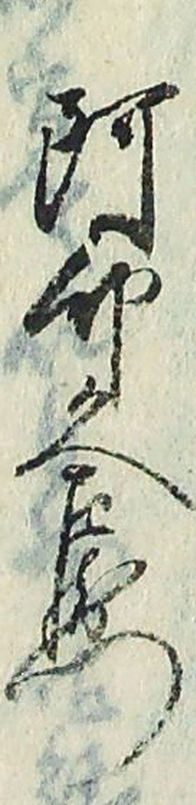阿部久左衛門
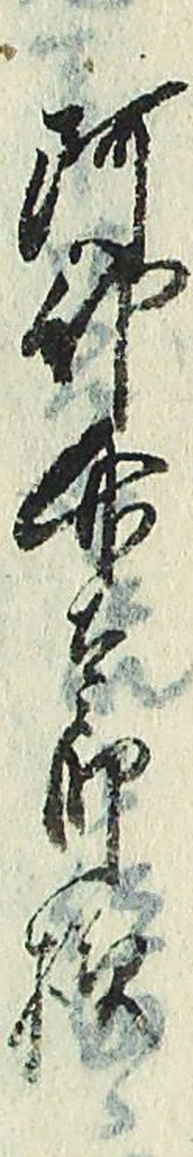阿部竹太郎様
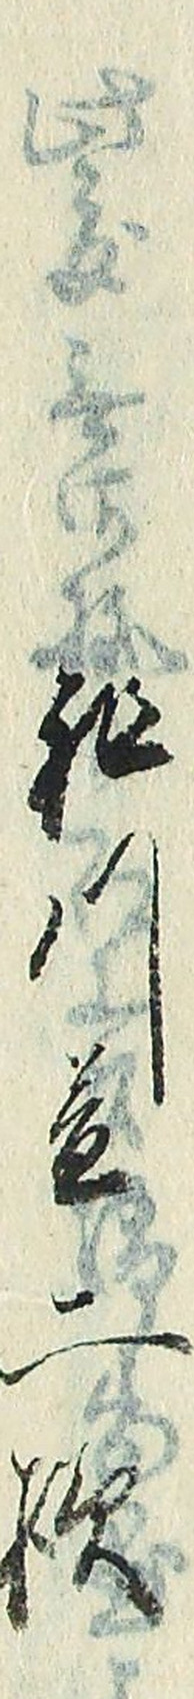祖川益二様
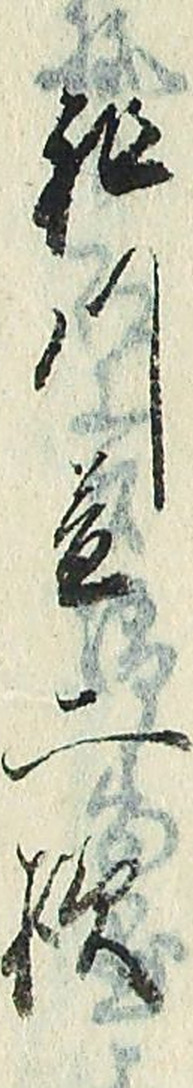祖川益二様

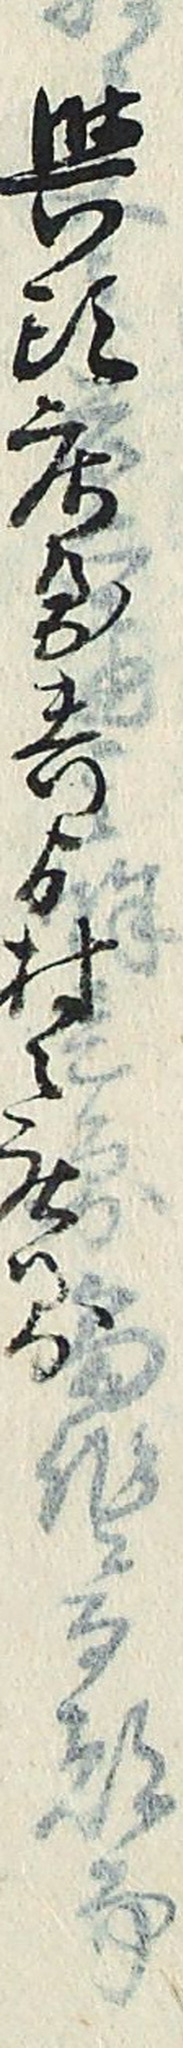與頭庄屋共ゟ村々庄屋
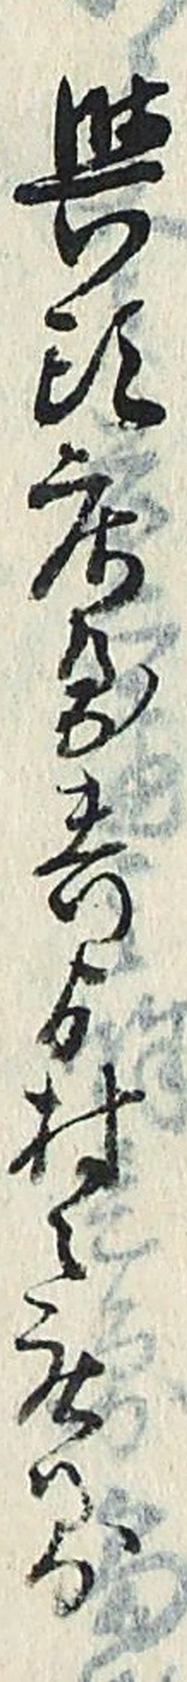與頭庄屋共ゟ村々庄屋
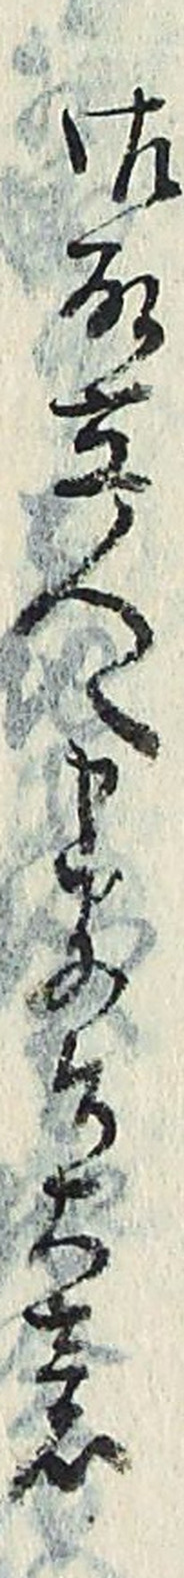御取立人へ申聞候大意
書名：諸御趣意書并御下知向之写
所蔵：鳴門教育大学 Naruto University of Education
